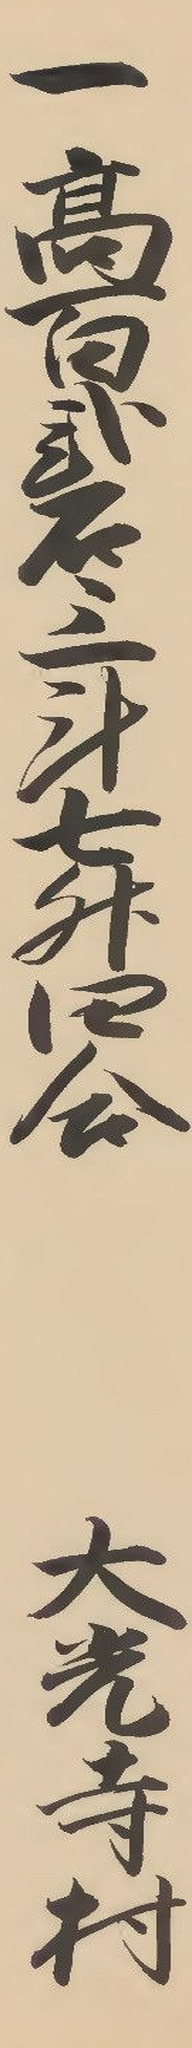一高百弐石三斗七升四合大光寺村
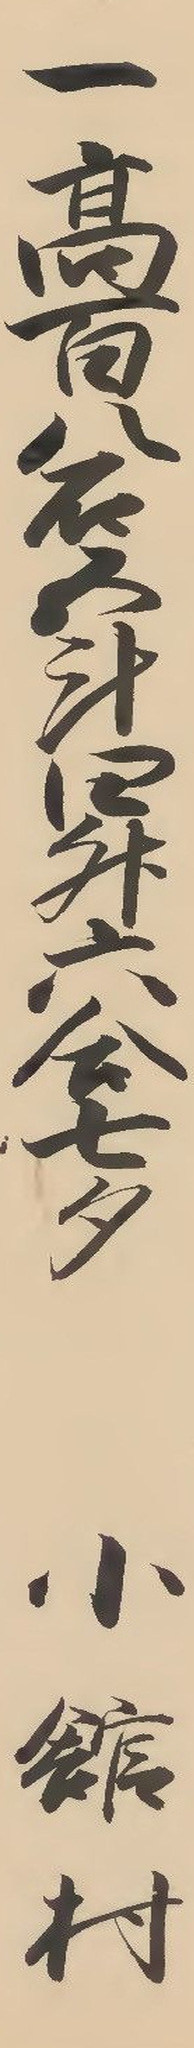一高百八石五斗四升六合七勺小館村
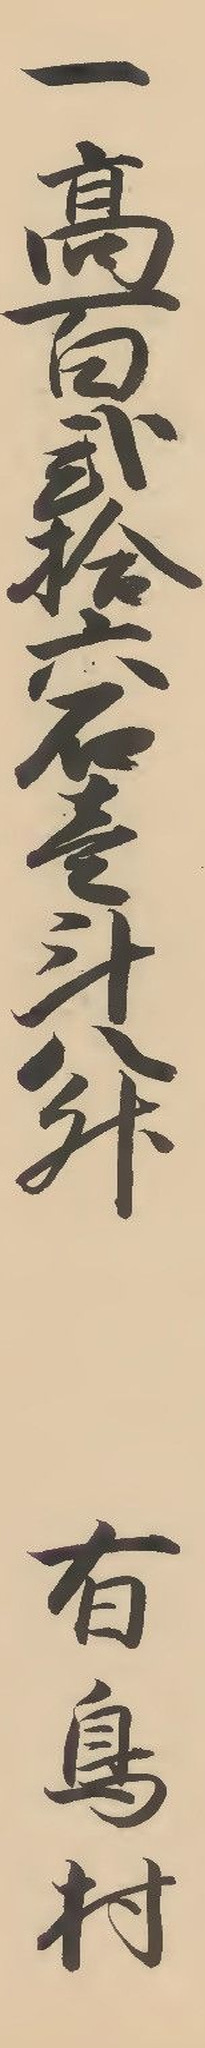一高百弐拾六石壱斗八升有鳥村

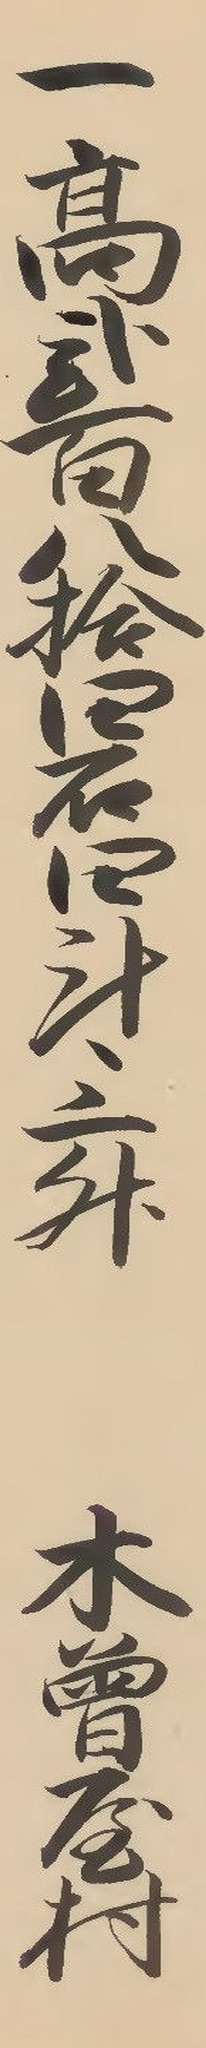一高弐百八拾四石四斗三升木曽屋村
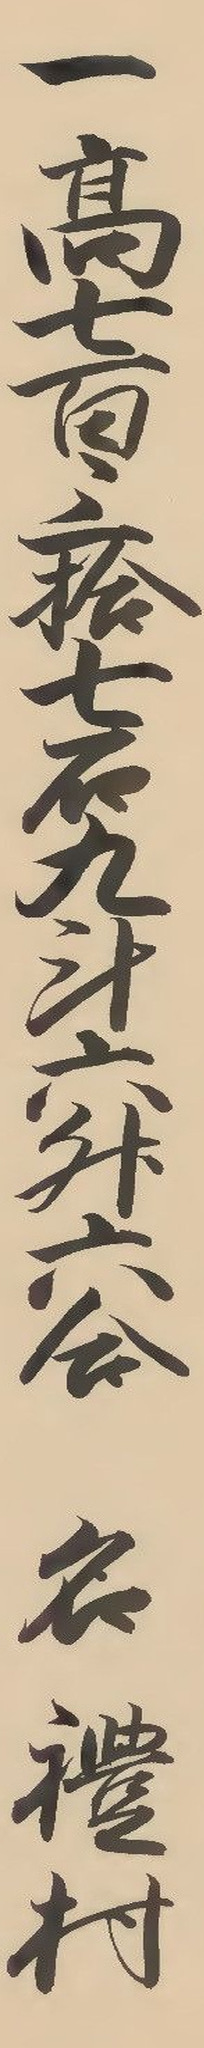一高七百三拾七石九斗六升六合名礼村
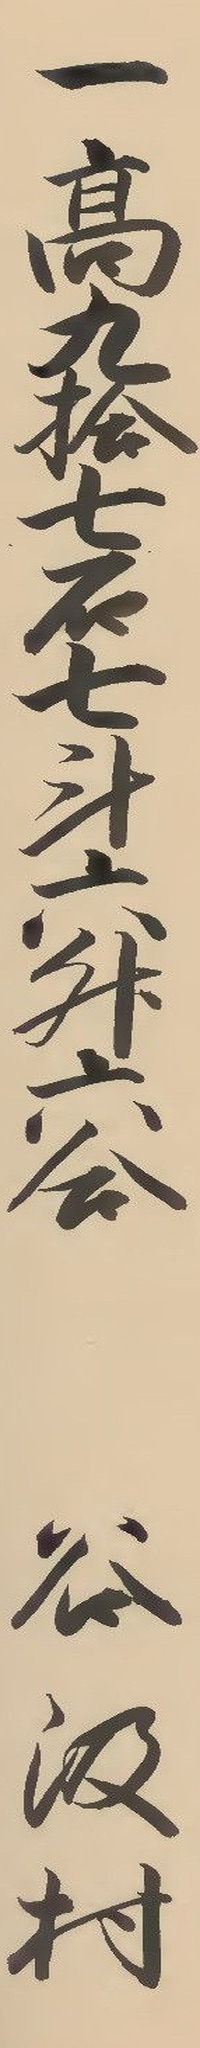一高九拾七石七斗六升六合谷汲村
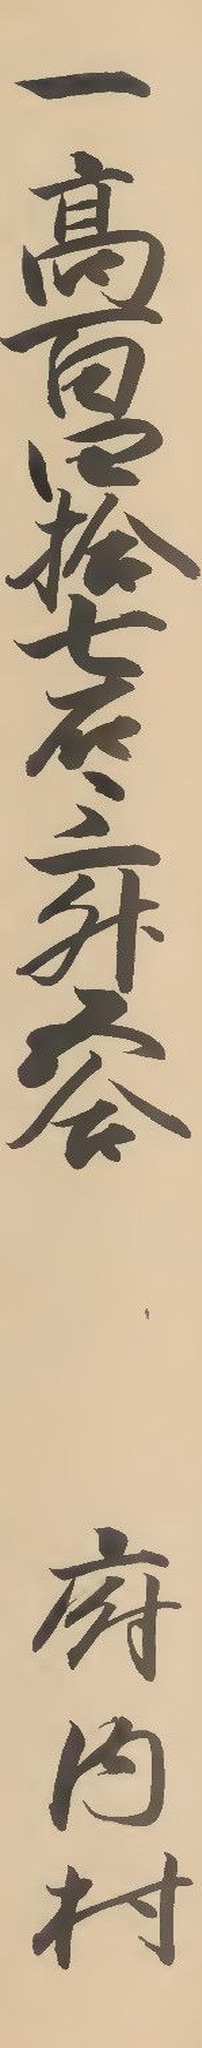一高百四拾七石三升五合府内村
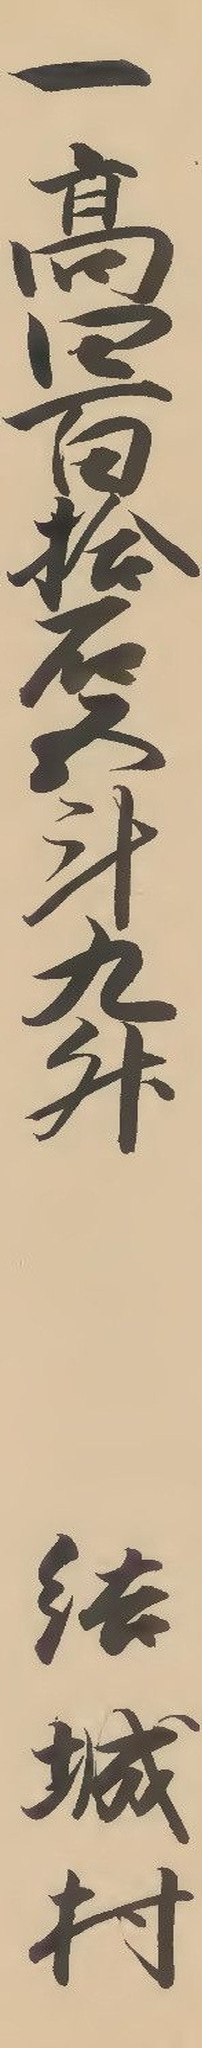一高四百拾石五斗九升結城村
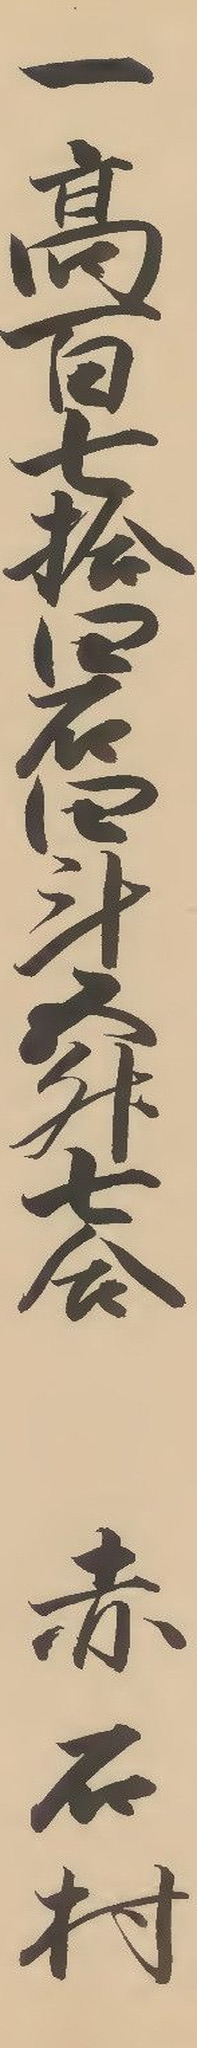一高百七拾四石四斗五升七合赤石村
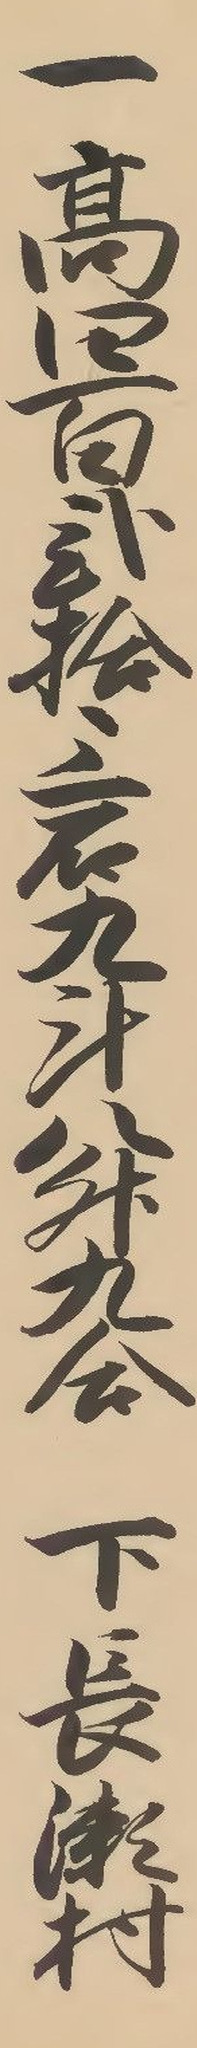一高四百弐拾三石九斗八升九合下長瀬村

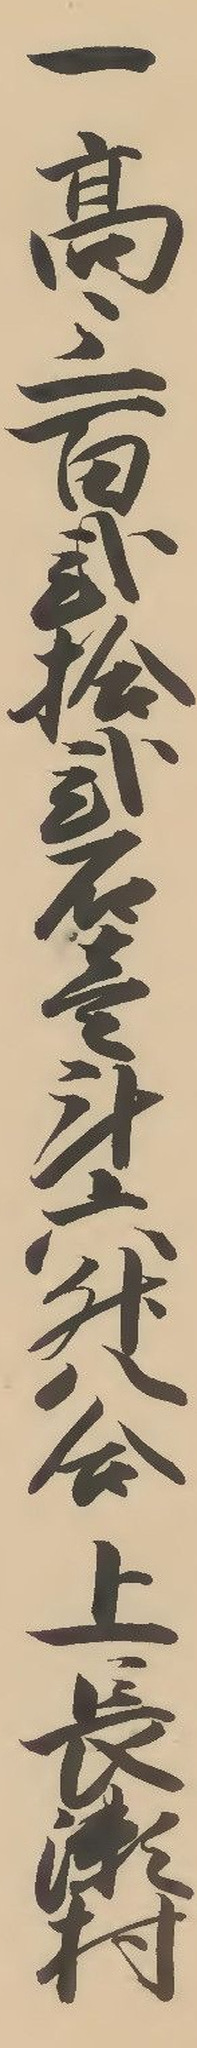一高三百弐拾弐石壱斗六升八合上長瀬村
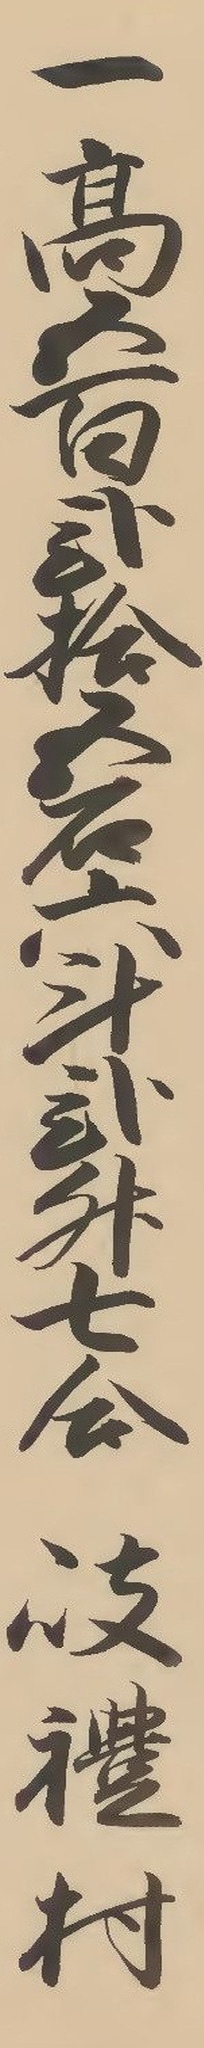一高五百弐拾五石六斗弐升七合岐礼村
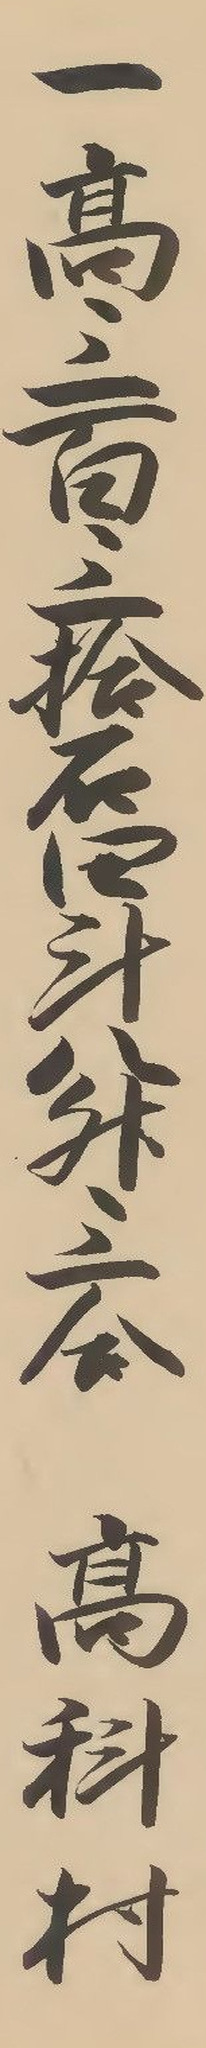一高三百三拾石四斗八升三合高科村
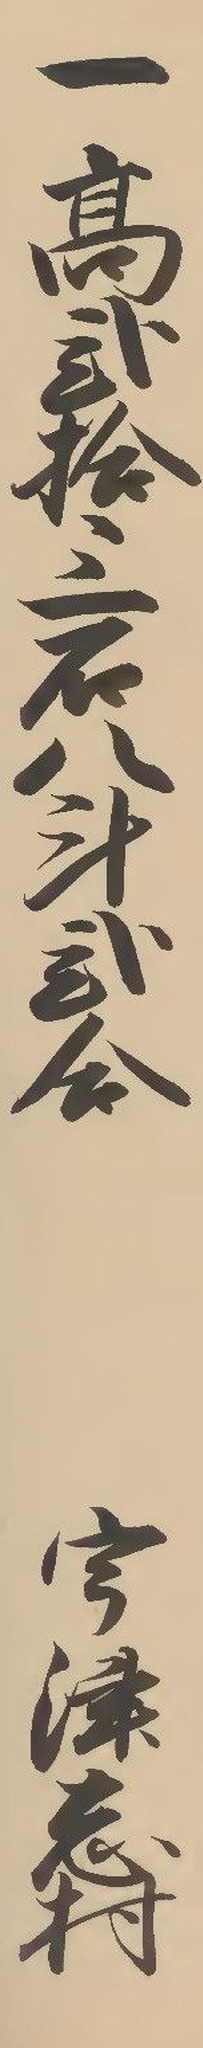一高弐拾三石八斗弐合宇津志村
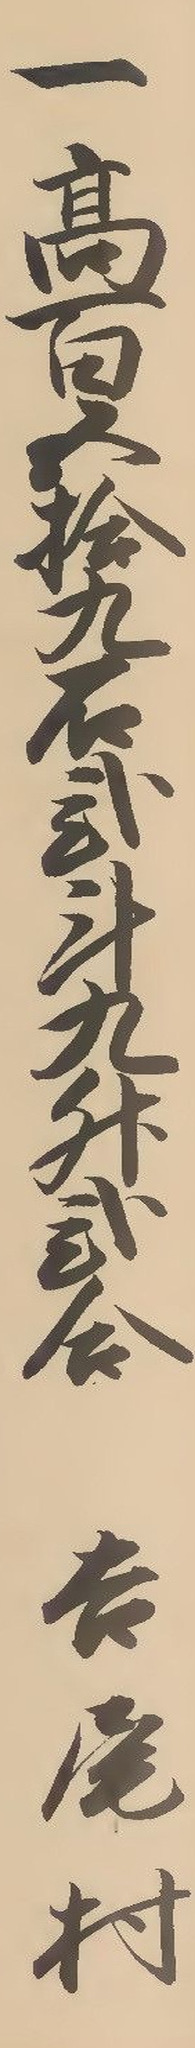一高百五拾九石弐斗九升弐合吉尾村
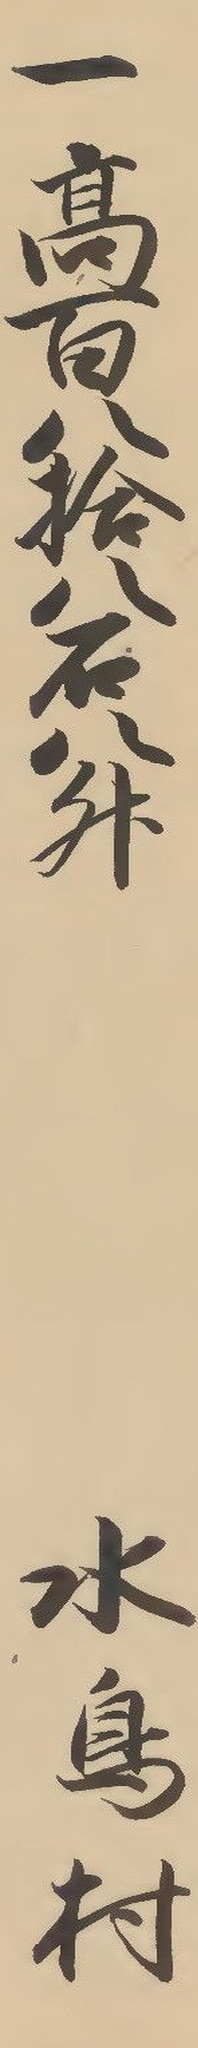一高百八拾八石八升水鳥村
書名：美濃国郷帳
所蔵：国立公文書館 National Archives of Japan
